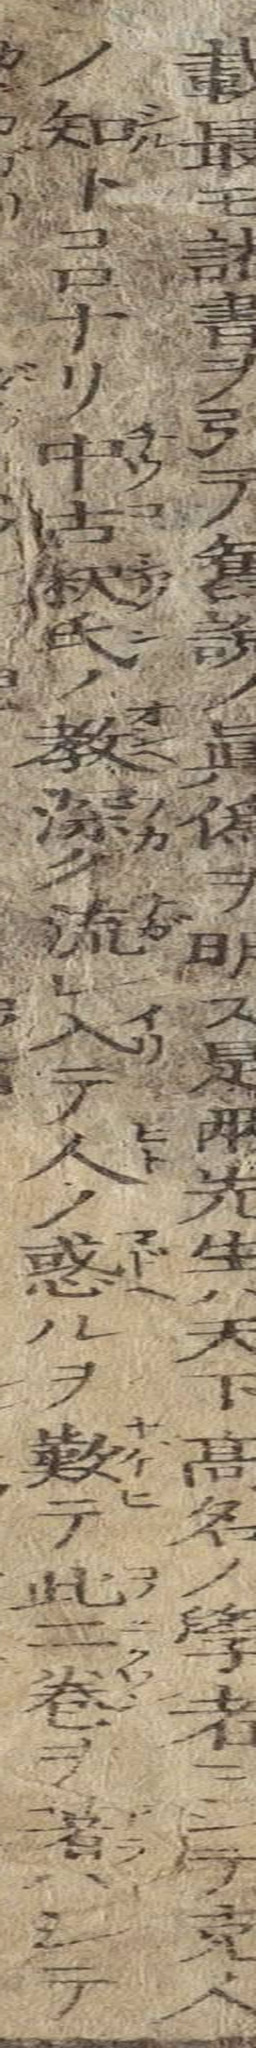ノ知トコロナリ中古釈氏ノ教深ク流レ入テ人ノ惑ルヲ歎テ此二巻ヲ著ハシテ
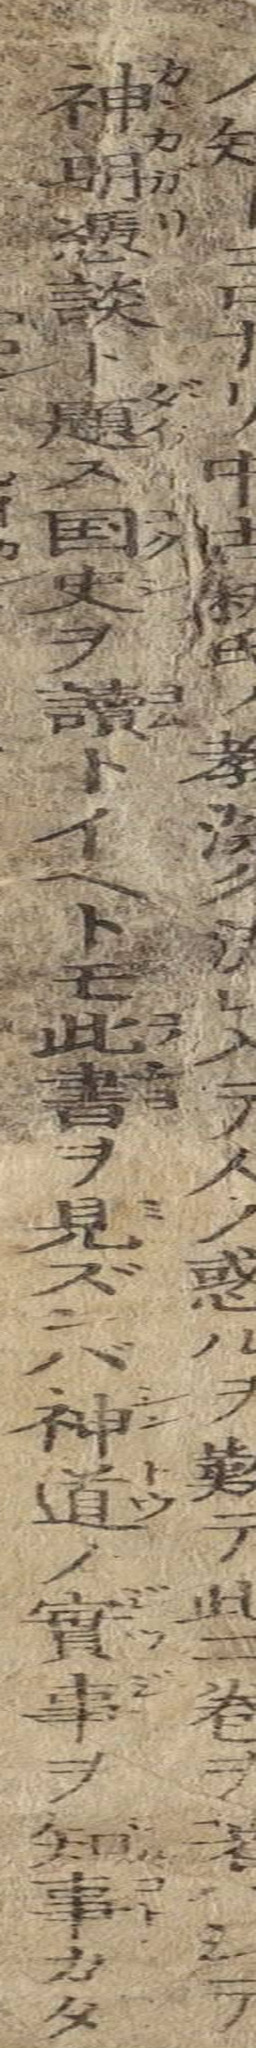神明憑談ト題ス国史ヲ読トイヘトモ此書ヲ見ズンバ神道ノ実事ヲ知事カタ
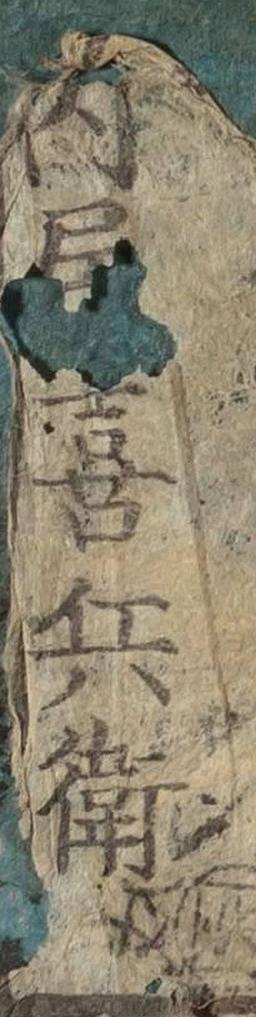河内屋喜兵衛

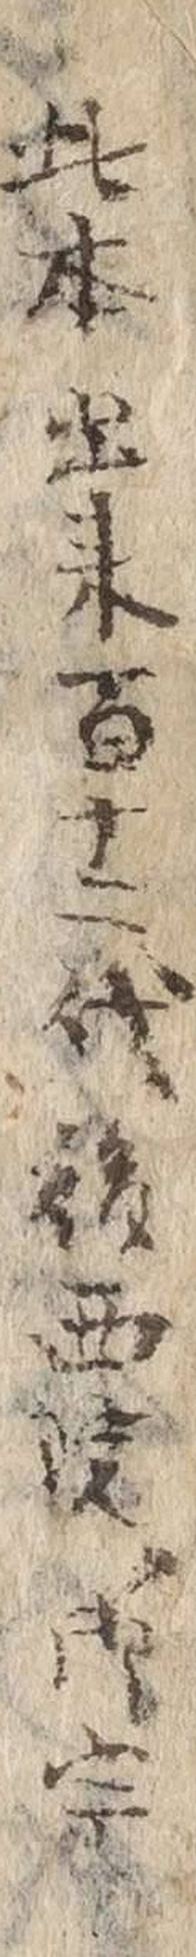此本出来百十二代後西院御宇
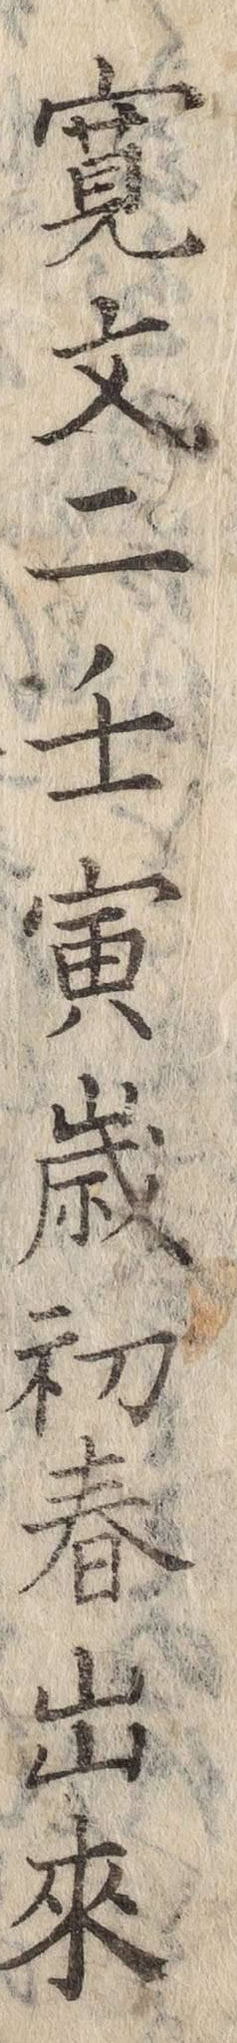寛文二壬寅歳初春出来
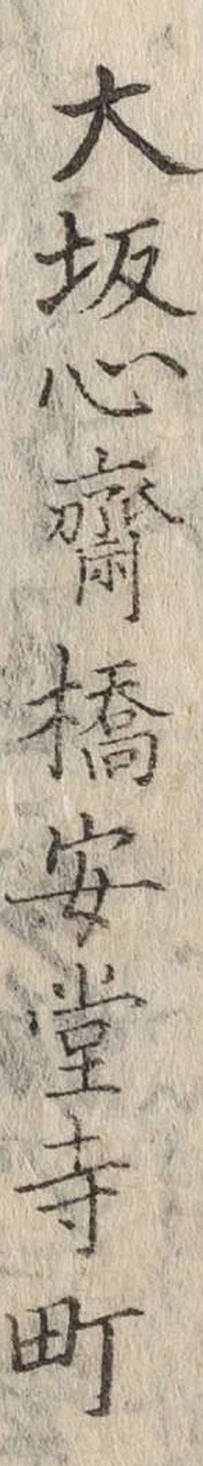大坂心斎橋安堂寺町
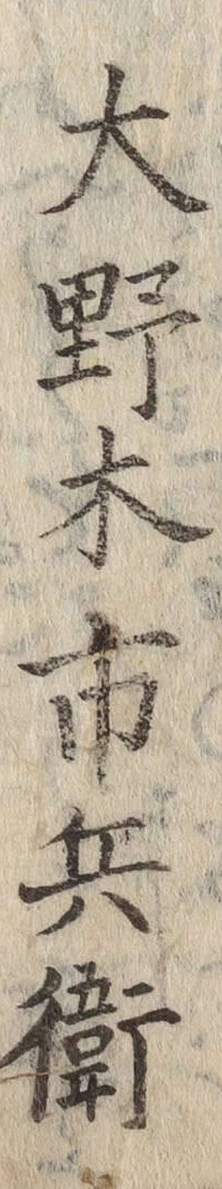大野木市兵衛
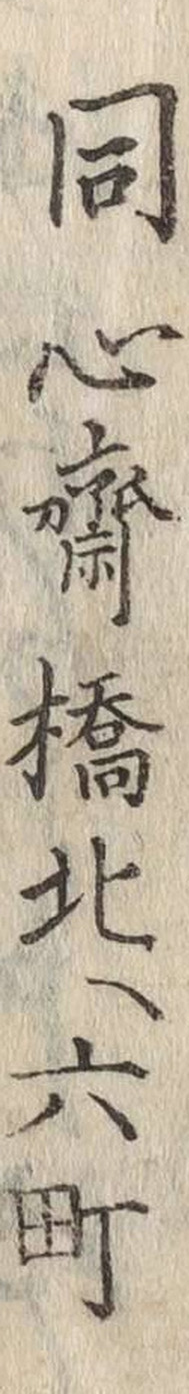同心斎橋北へ六町
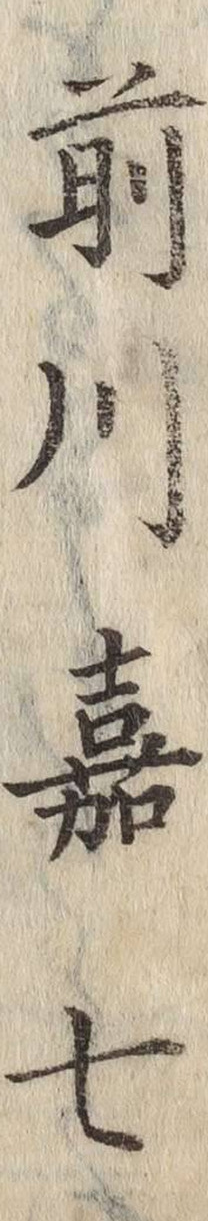前川嘉七
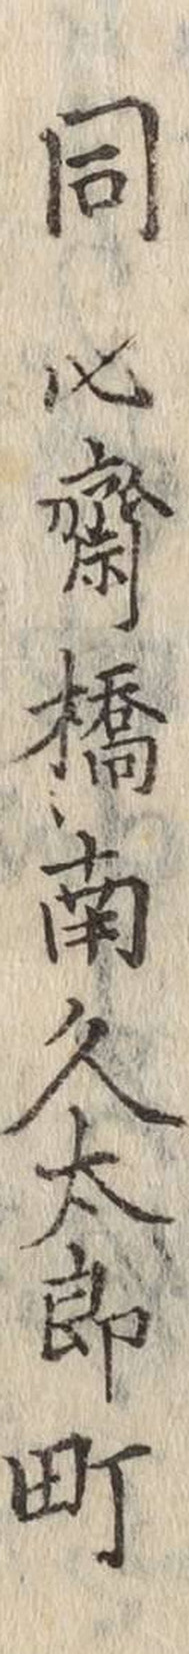同心斎橋南久太郎町
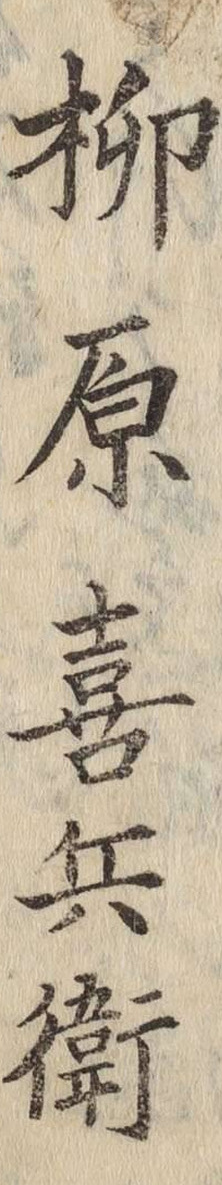柳原喜兵衛
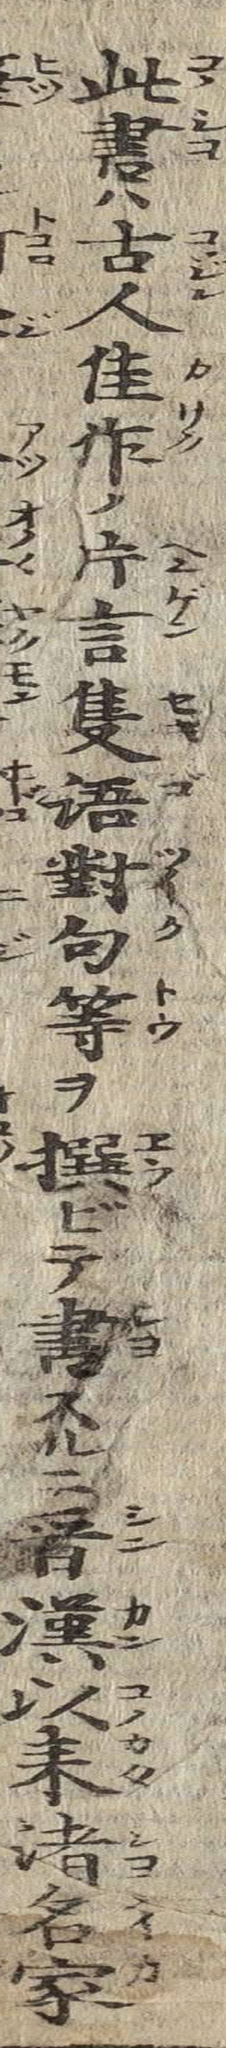此書ハ古人佳作ノ片言隻語対句等ヲ撰ビテ書スルニ晋漢以来諸名家
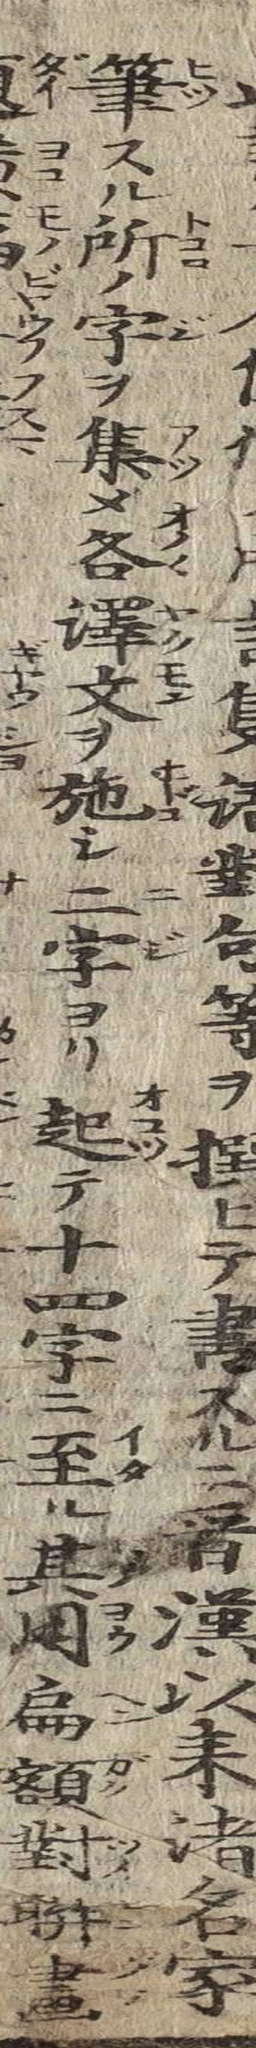筆スル所ノ字ヲ集メ各訳文ヲ施シ二字ヨリ起テ十四字ニ至ル其用扁額対聯画
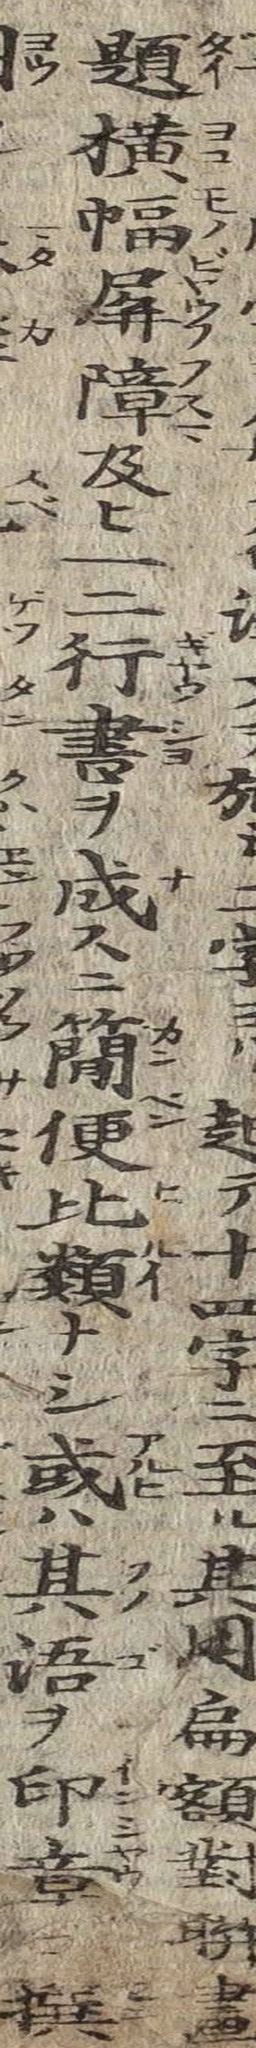題横巾屏障及ヒ一二行書ヲ成スニ簡便比類ナ或ハ其語ヲ印章ニ撰
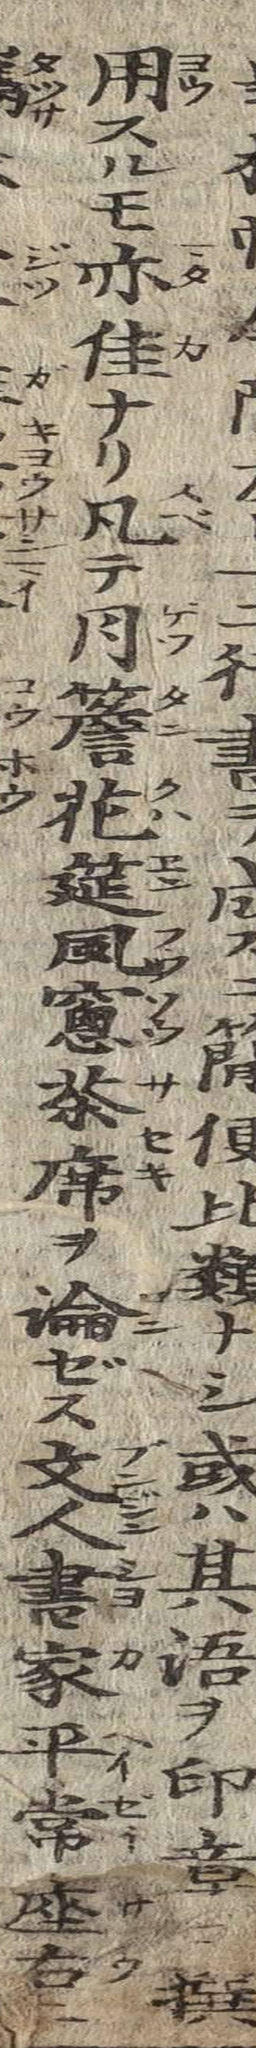用スルモ亦佳ナリ凡テ月簷花筵風窓茶席ヲ論ゼス文人書家平常座右ニ
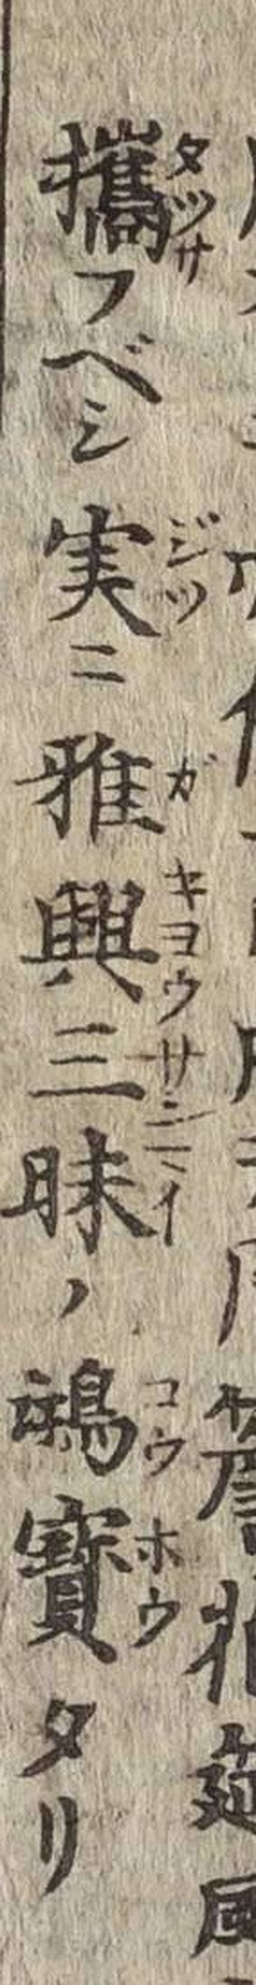携フベシ実ニ雅興三昧ノ鴻宝タリ
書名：弘法大師御傳記
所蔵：京都府立京都学・歴彩館 国文学研究資料館
